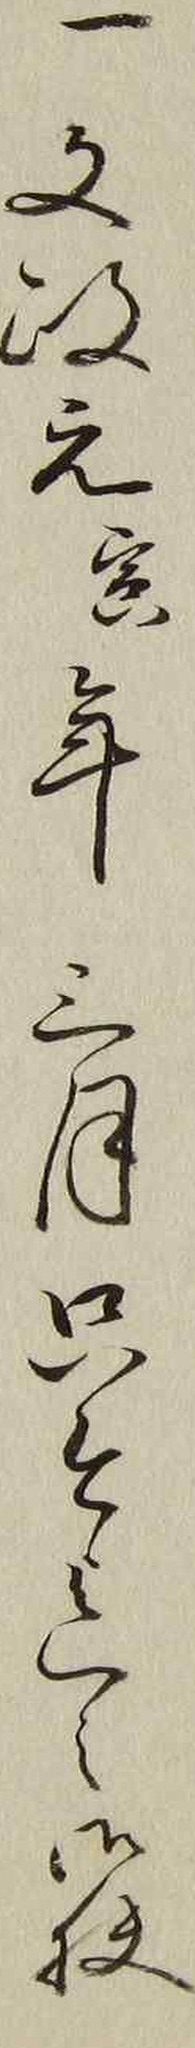一文政元寅年三月只今迄之御扶
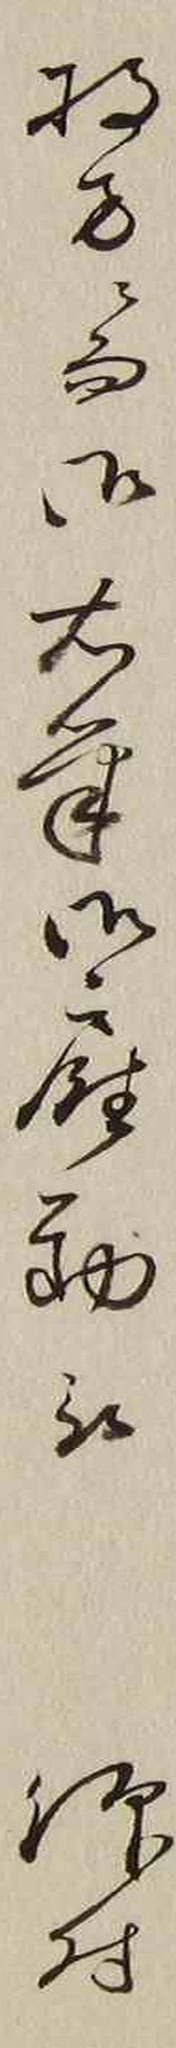持方ニ而御右筆御雇勤被仰付
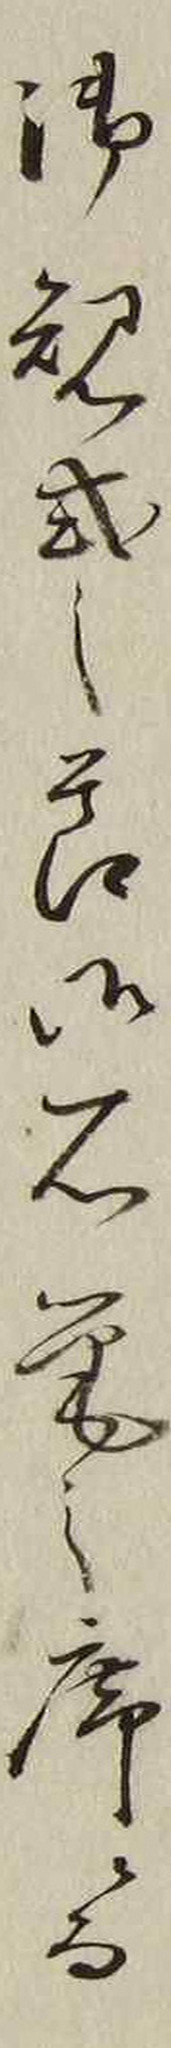御規式之節御右筆之席ニ而
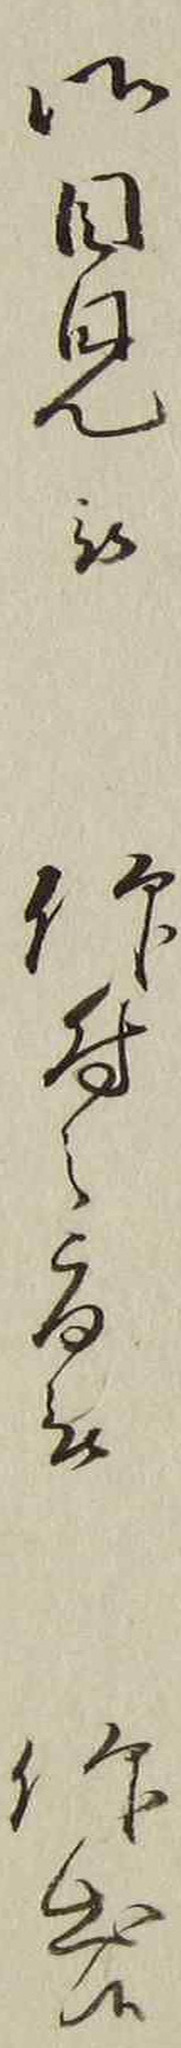御目見被仰付之旨被仰出候

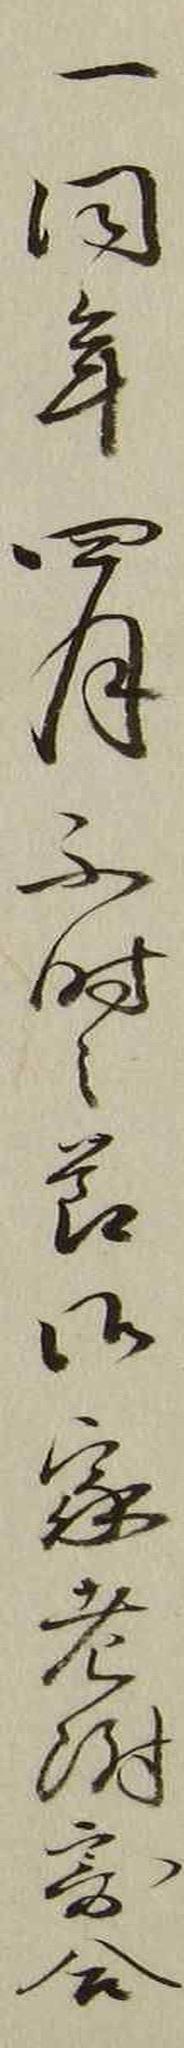一同年四月不時之節御家老附寄合
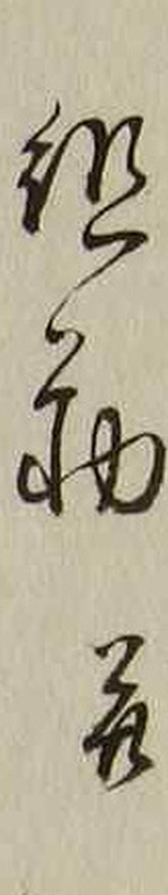組勤并
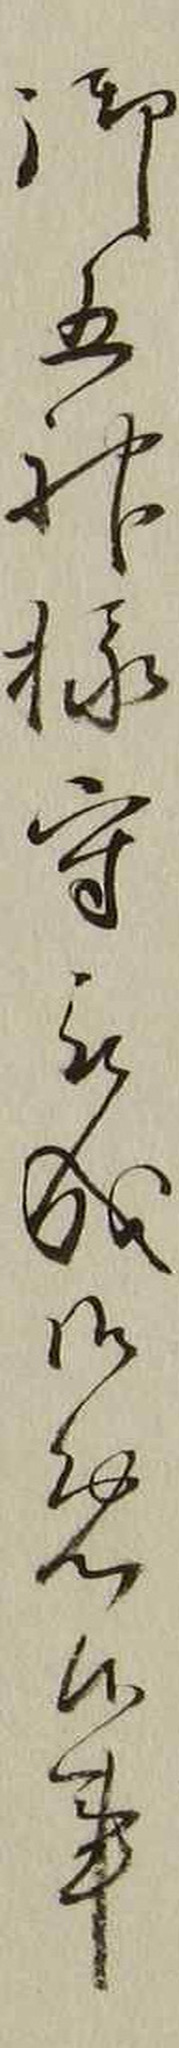御五神様守被成御免候事
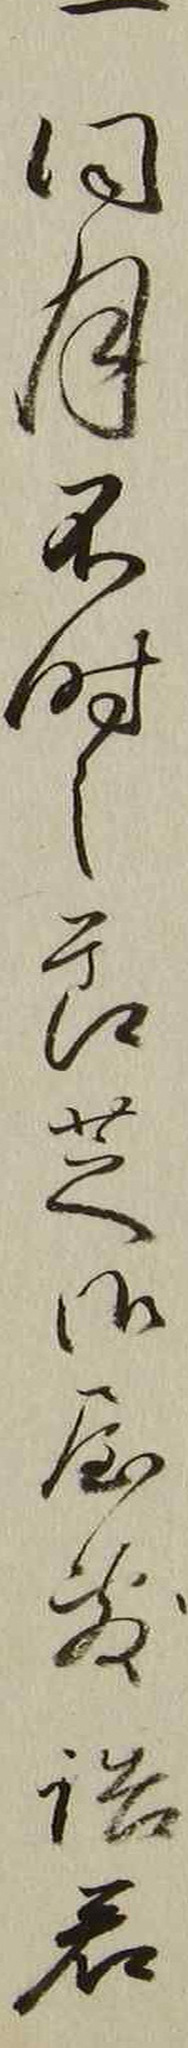一同月不時之節芝御屋敷詰若
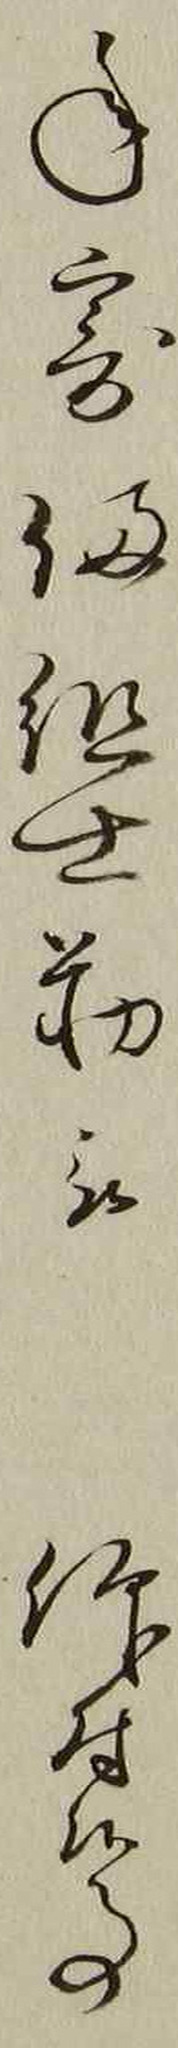年寄備組士勤被仰付候事
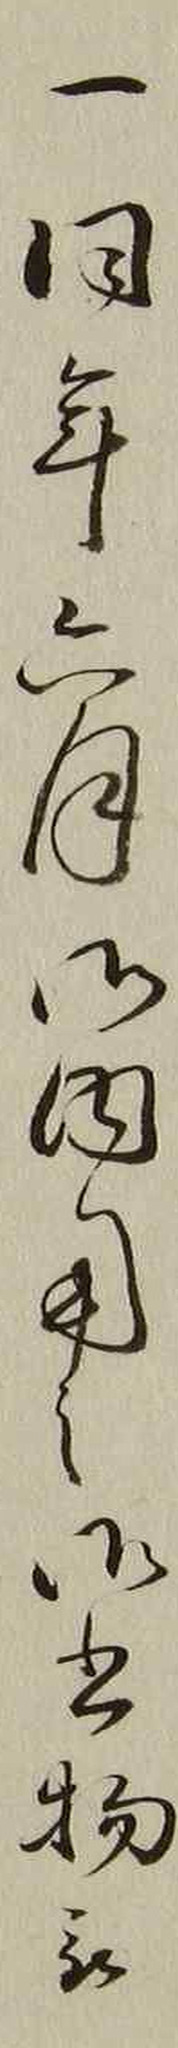一同年六月御内用之御書物被
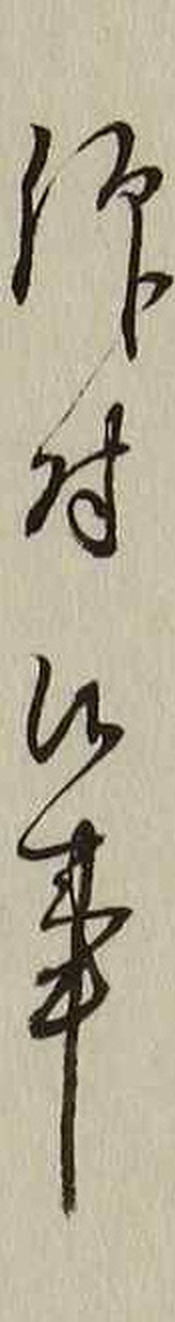仰付候事
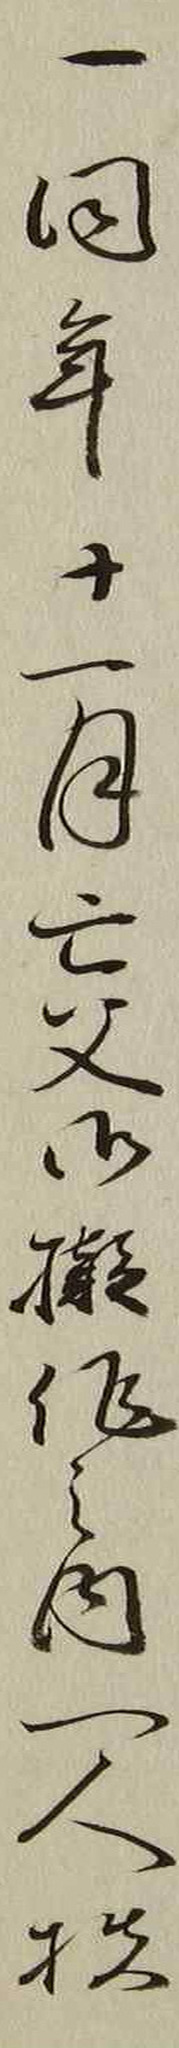一同年十一月亡父御擬作之内一人扶
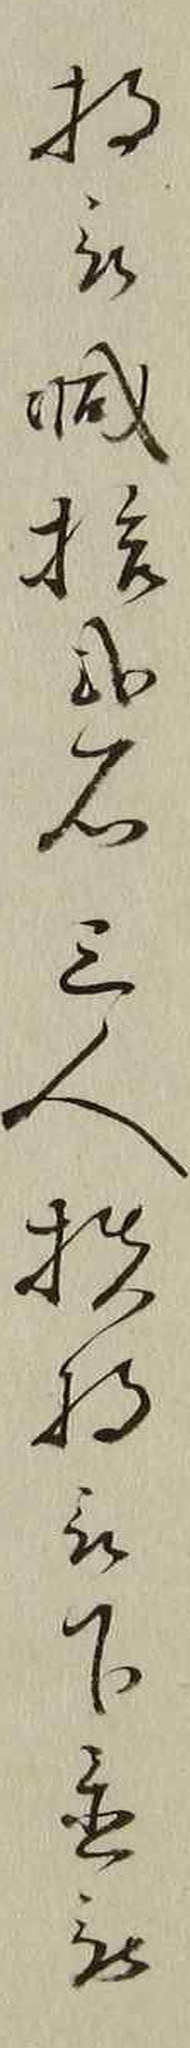持被減拾弐石三人扶持被下置被
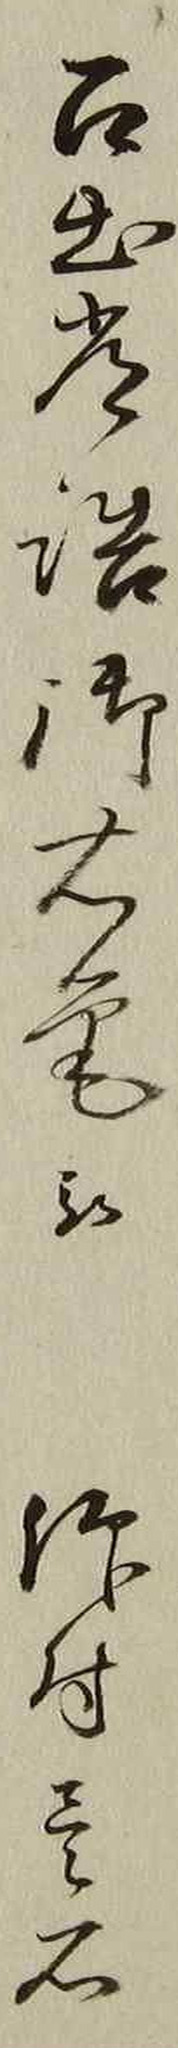召出常詰御右筆被仰付壱石
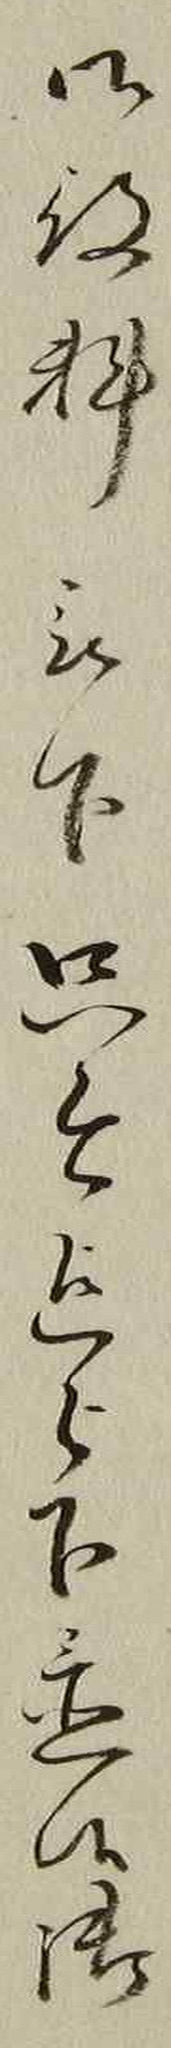御役料被下只今迄被下置候御
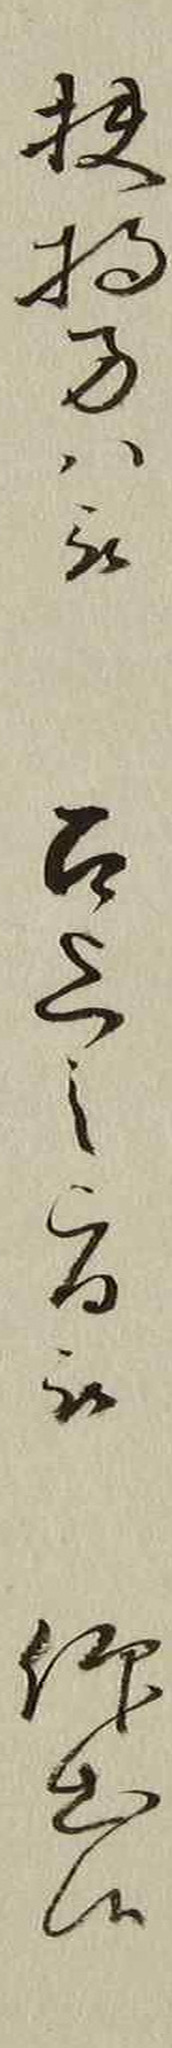扶持方ハ被召上之旨被仰出候
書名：諸士系譜　巻之4　い之部4
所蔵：会津若松市立会津図書館
